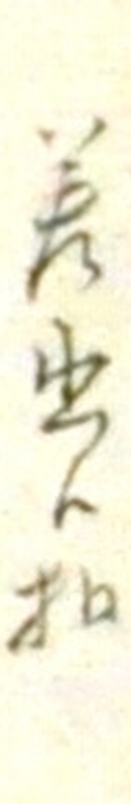差出候扣
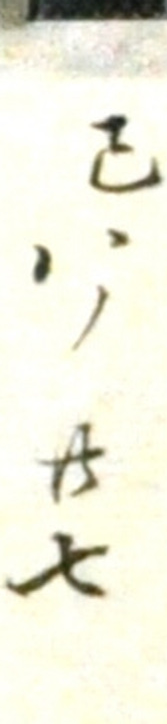己ハノ廿七
